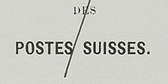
Postes Suisses.
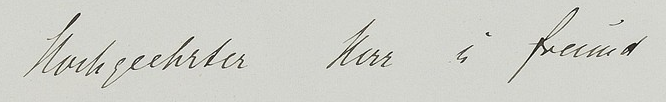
Hochgeehrter Herr u Freund
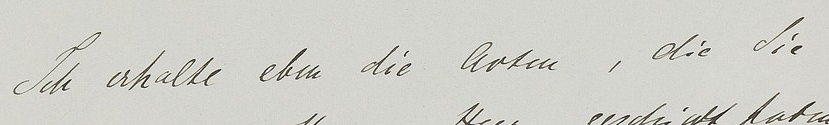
Ich erhalte eben die Acten, die Sie
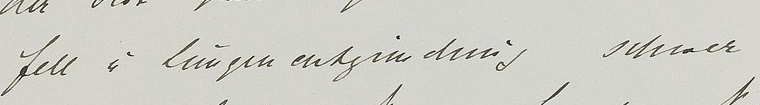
fell u Lungenentzündung schwer
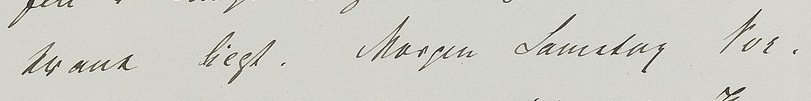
krank liegt. Morgen Samstag Vor-
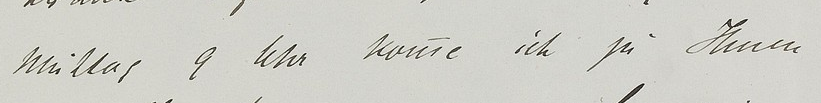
mittag 9 Uhr komme ich zu Ihnen
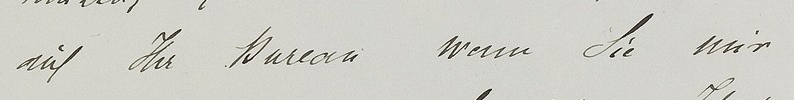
auf Ihr Bureau wenn Sie mir
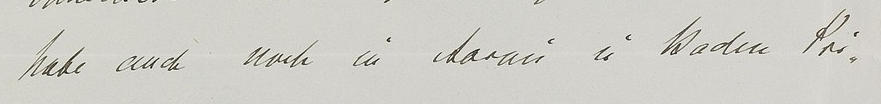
habe auch noch in Aarau u Baden Pri-
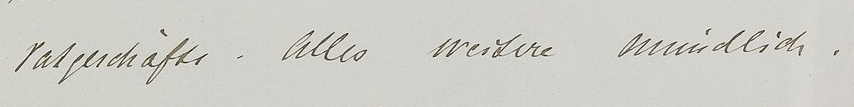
vatgeschäfte. Alles weitere mündlich.
